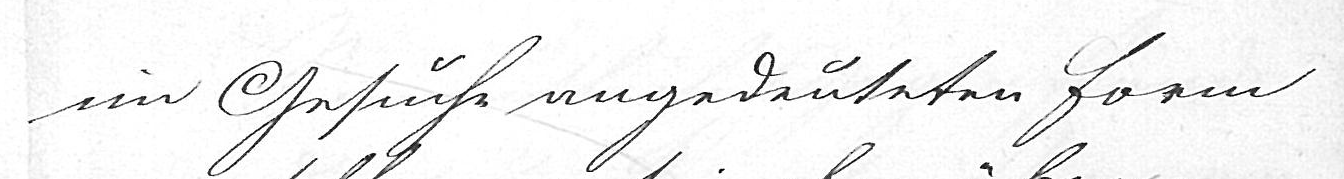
im Gesuche angedeuteten Form
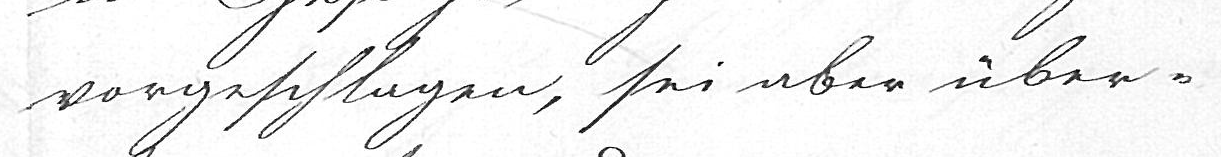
vorgeschlagen, sei aber über-
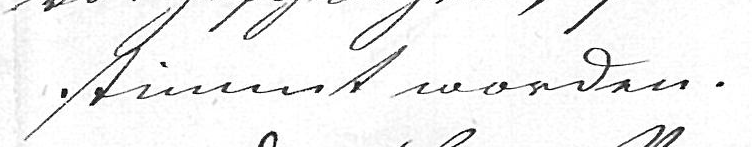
stimmt worden.
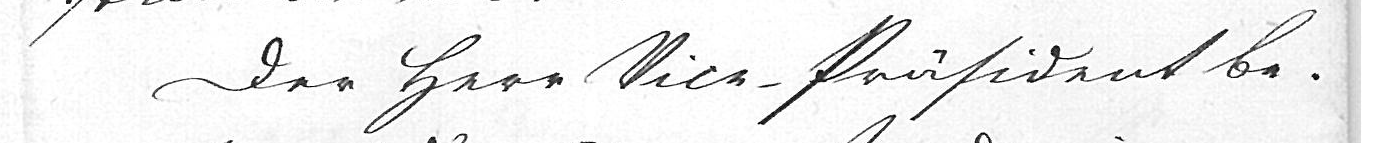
Der Herr Vice-Präsident be-
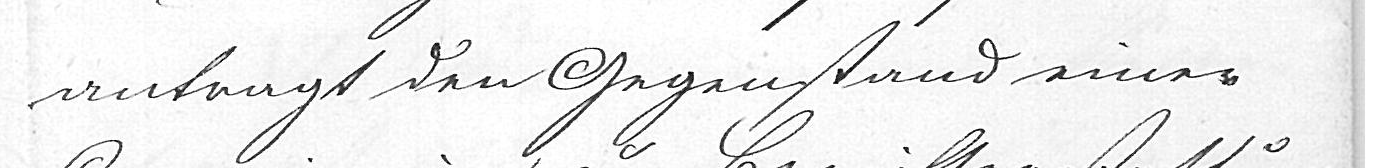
antragt den Gegenstand einer
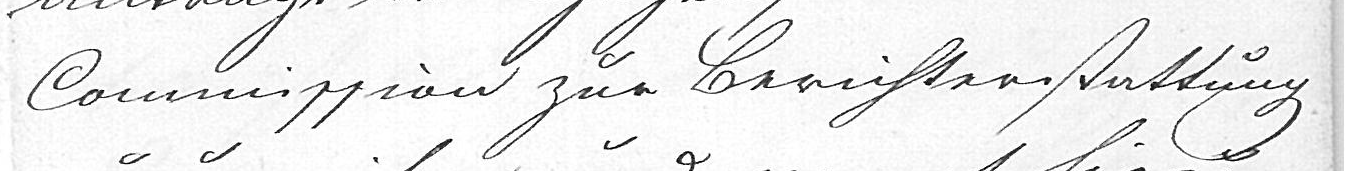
Commission zur Berichterstattung
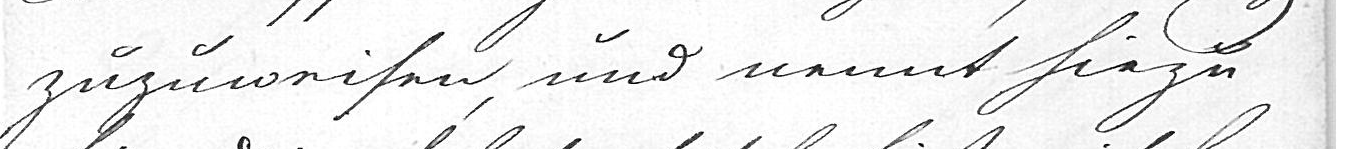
zuzuweisen und nennt hiezu
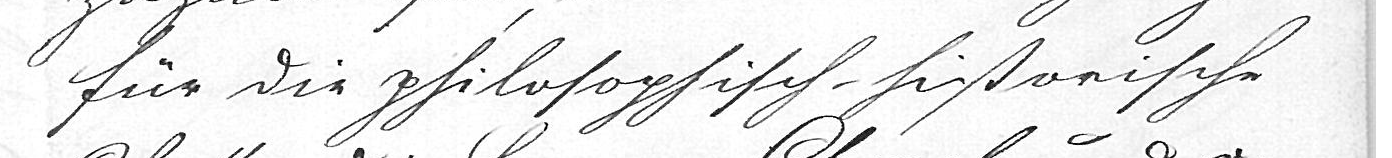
für die philosophisch-historische
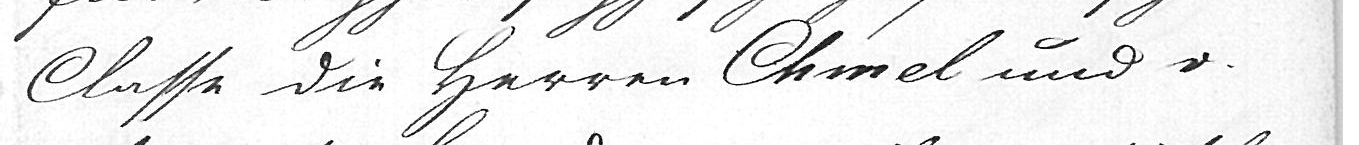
Classe die Herren Chmel und v.
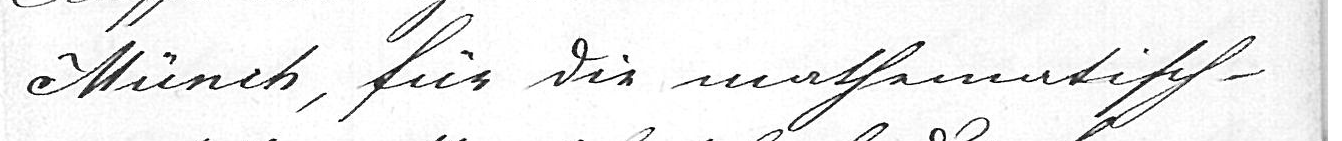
Münch, für die mathematisch-
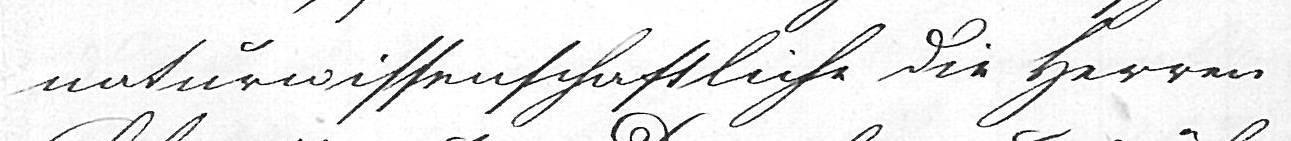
naturwissenschaftliche die Herren
